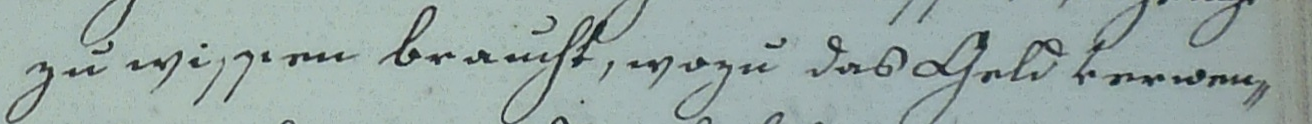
zu wissen braucht, wozu das Geld verwen¬
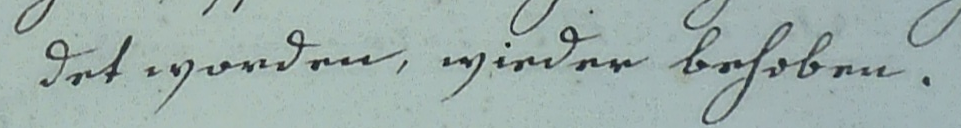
det worden, wieder behoben.
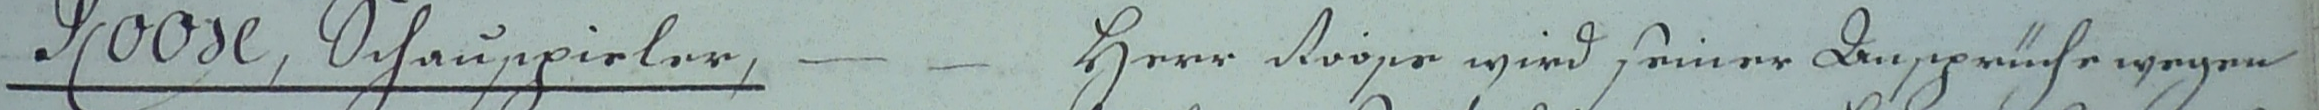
Roose, Schauspieler, _ _ Herr Roose wird seiner Ansprüche wegen
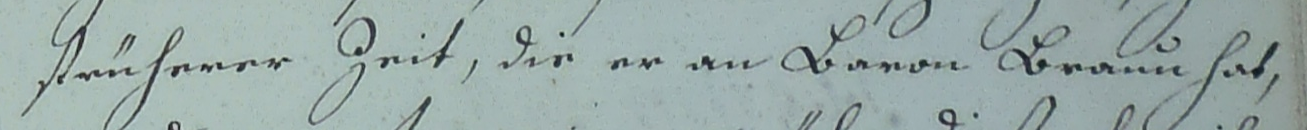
früherer Zeit, die er an Baron Braun hat,
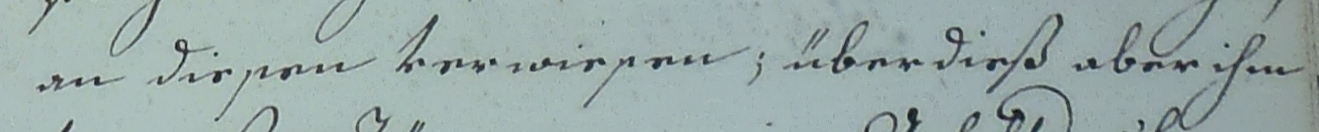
an diesen verwiesen; überdieß aber ihn
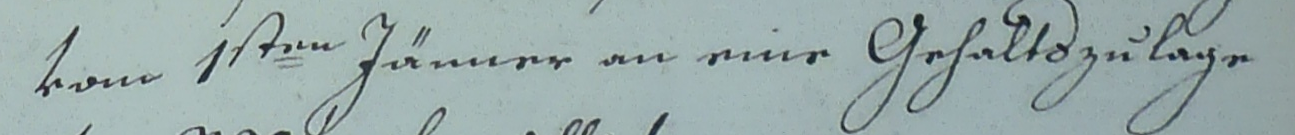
vom 1ste͇n Jänner an eine Gehaltszulage
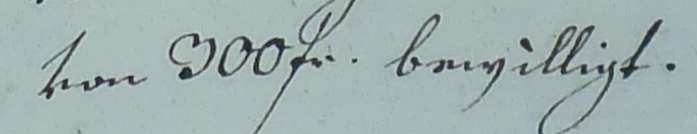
von 300 fr. bewilligt.
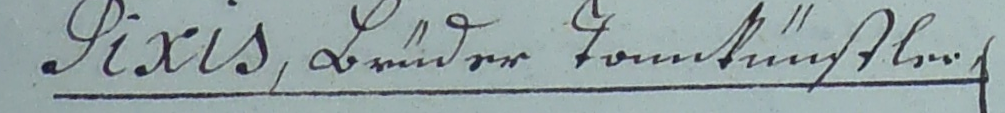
Pixis, Brüder Tonnkünstler,
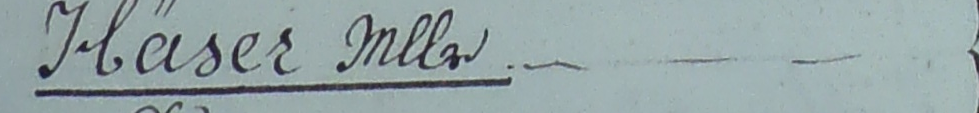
Häser Mlle. _ _ _
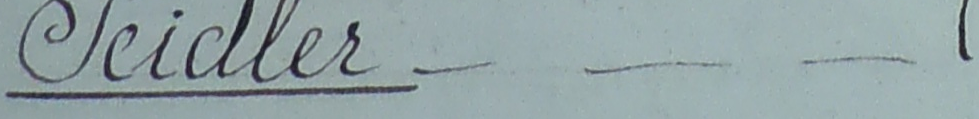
Seidler _ _ _
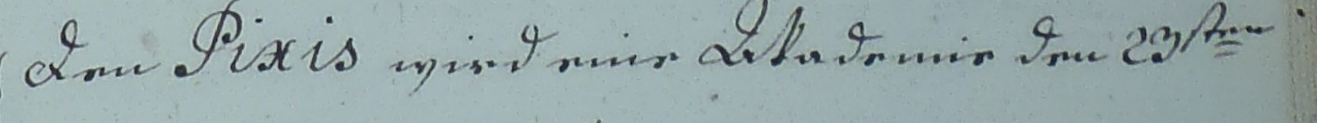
Den Pixis wird eineAkademie den 23ste͇n
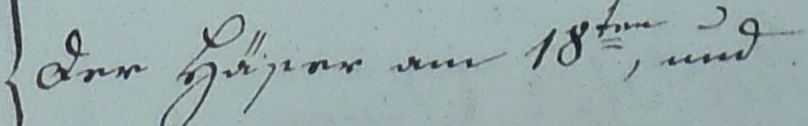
der Häser am 18te͇n, und
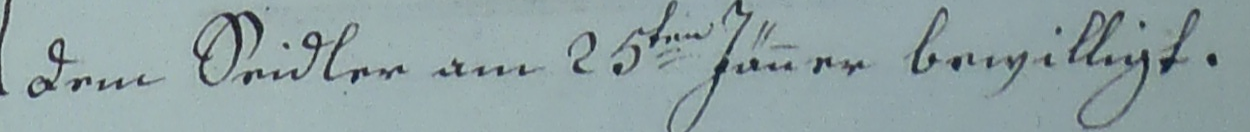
dem Seidler am 25te͇n Jän̅er bewilligt.
